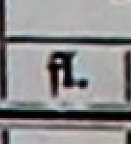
fl.
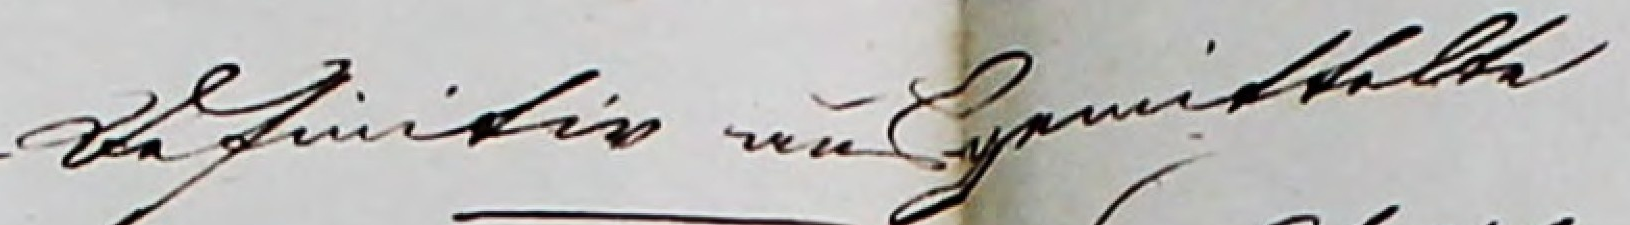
Definitiv aus gemittelte
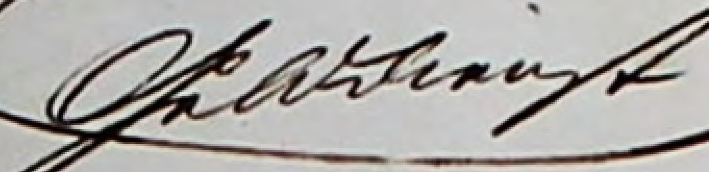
Gelddienst
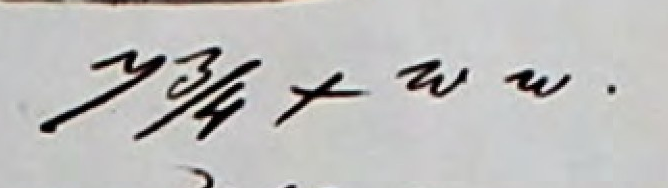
7 3/4 x w w.
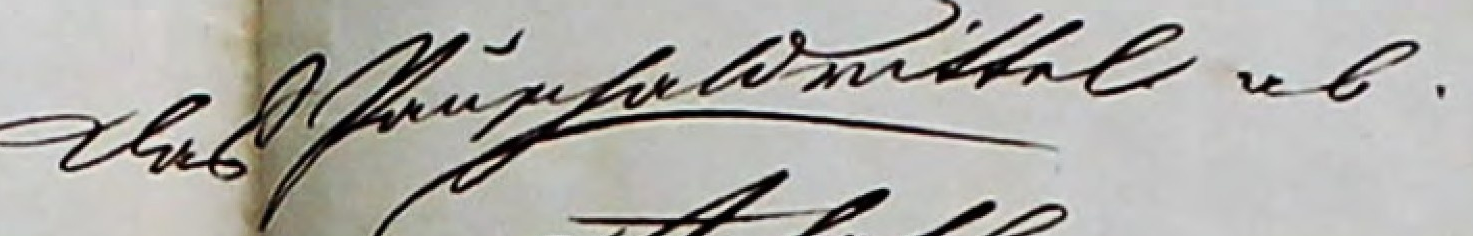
Das Pauschaldrittel ab.
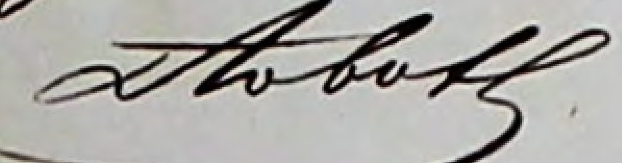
Aoboth
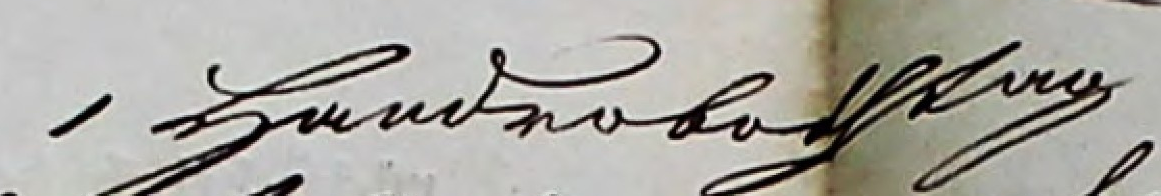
1 Handrobothtag
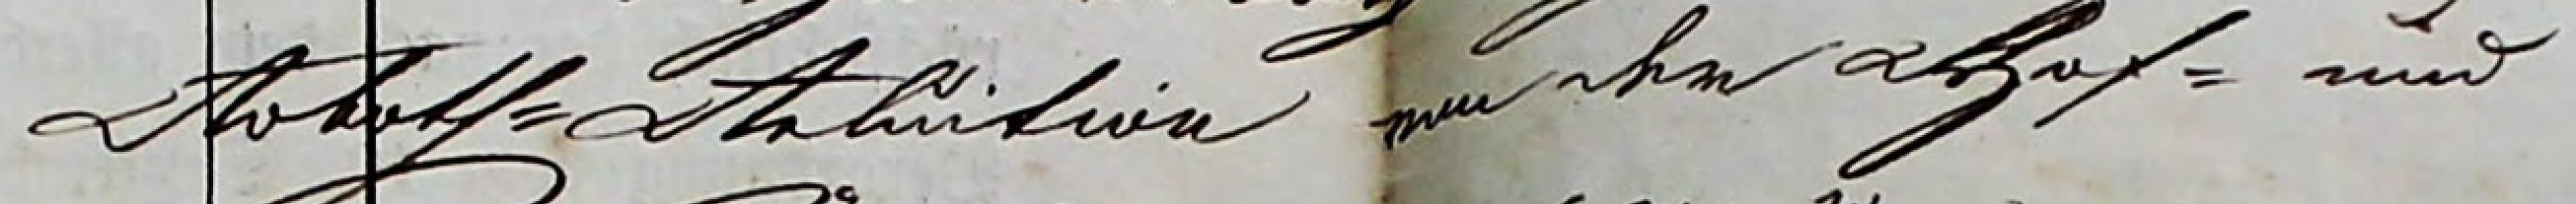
Aoboth=Anluition vom ckr Hof= und
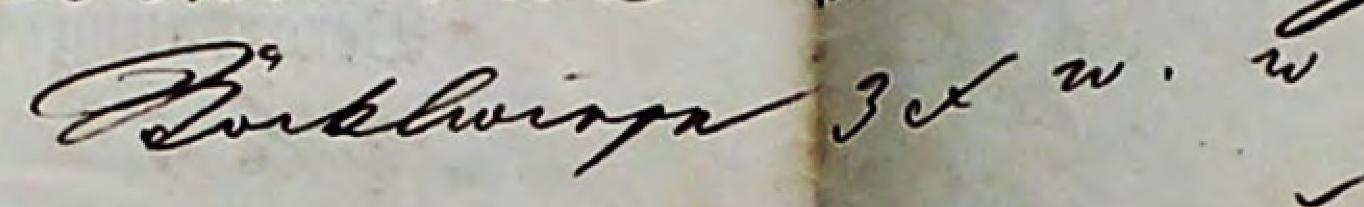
Böcklwiese 3 F w. w
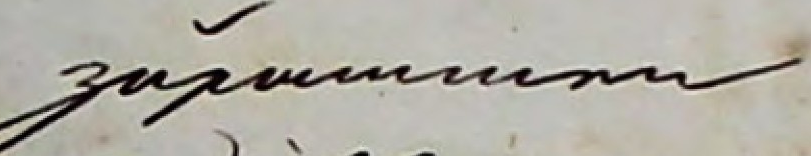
zusammen
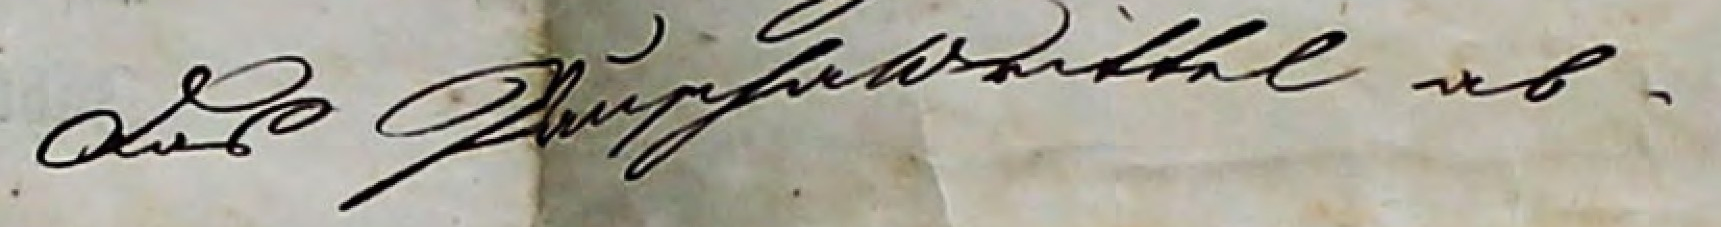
das Panschaldrittel ab
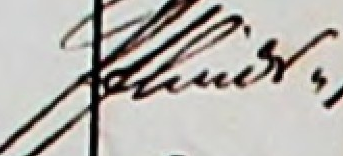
Pflinds„
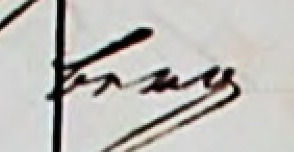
berg
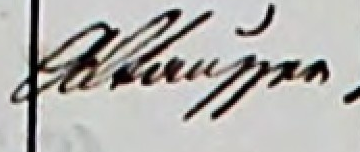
Altaussee
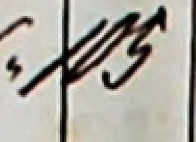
105
